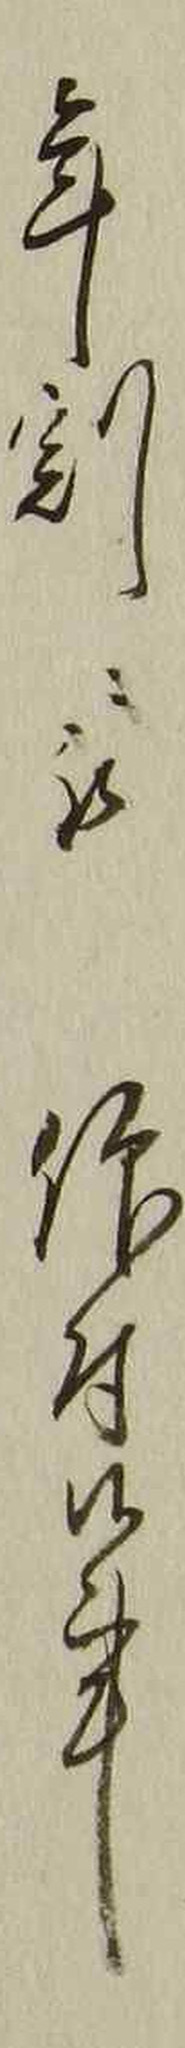年割ニ被仰付候事
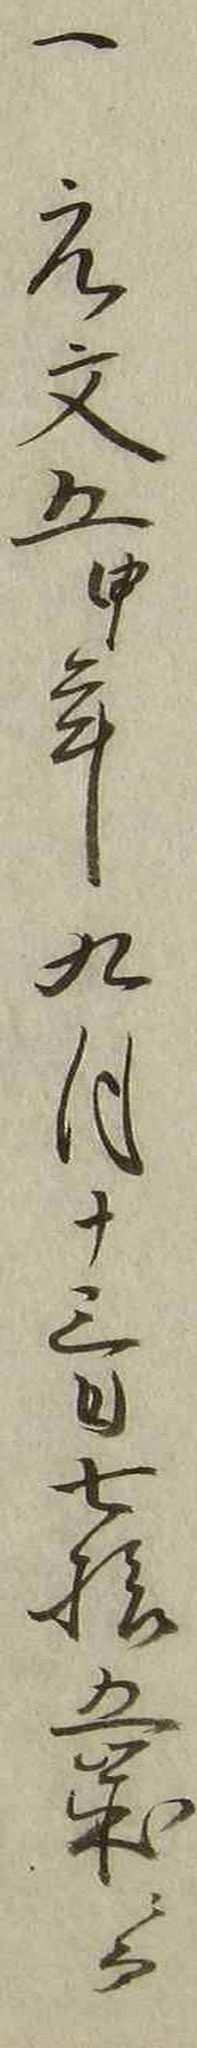一元文五申年九月十三日七拾五歳ニ而
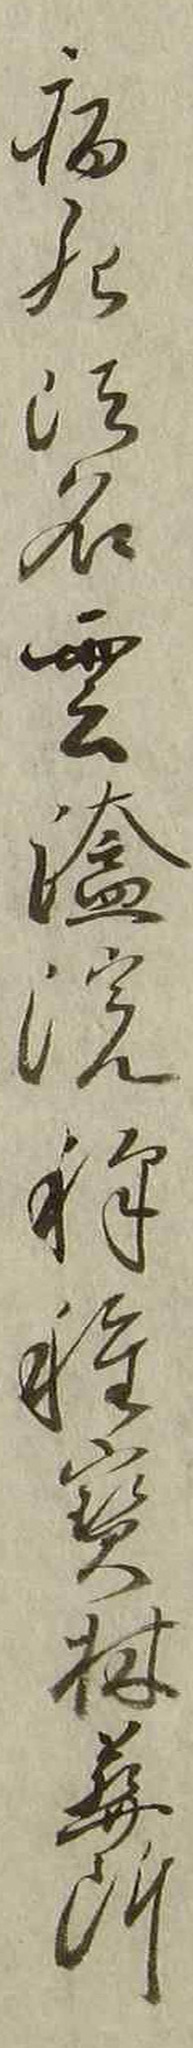病死法名雲溘院釈種宝林葬所
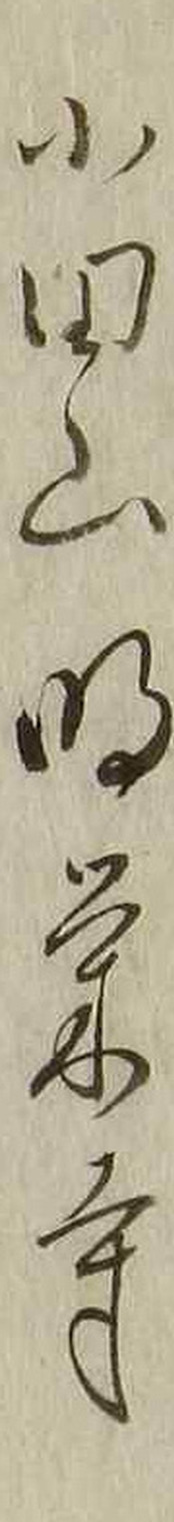小田山明栄寺
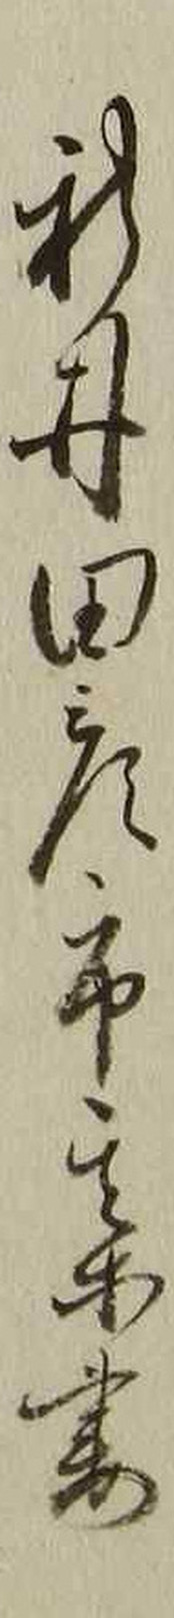女新井田彦市某妻
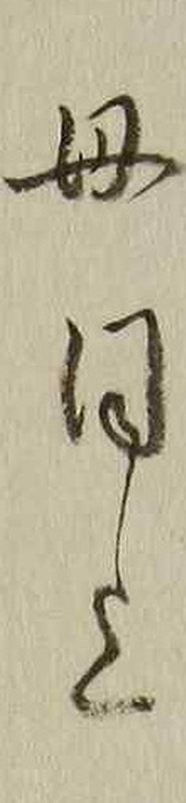母同上
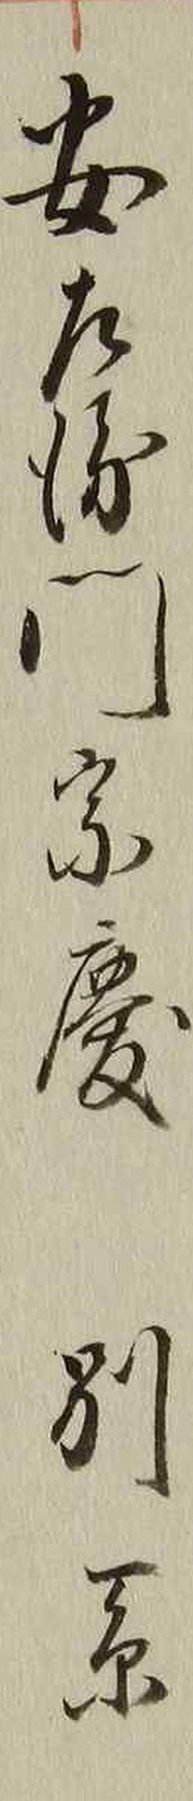安左衛門宗慶別系
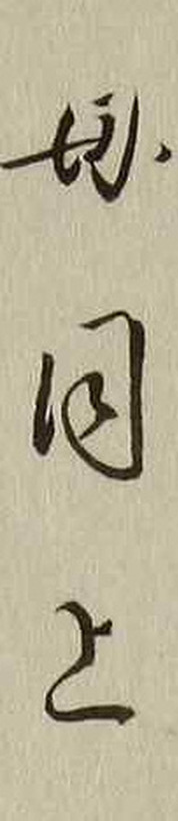母同上
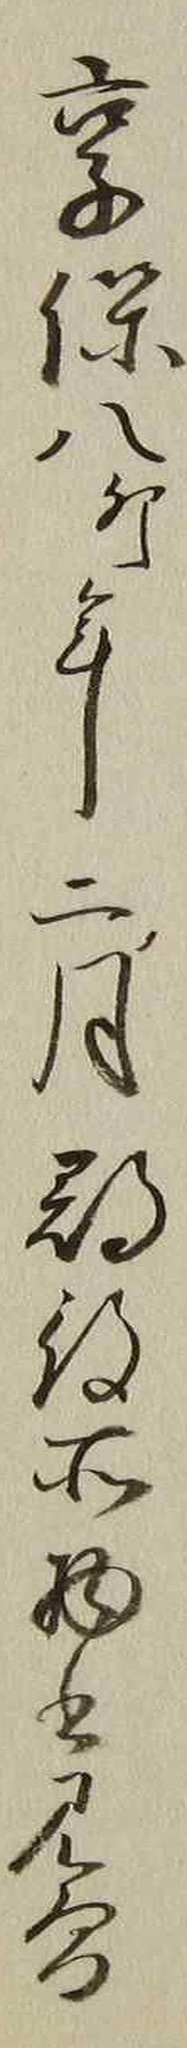享保八卯年二月郡役所物書見習
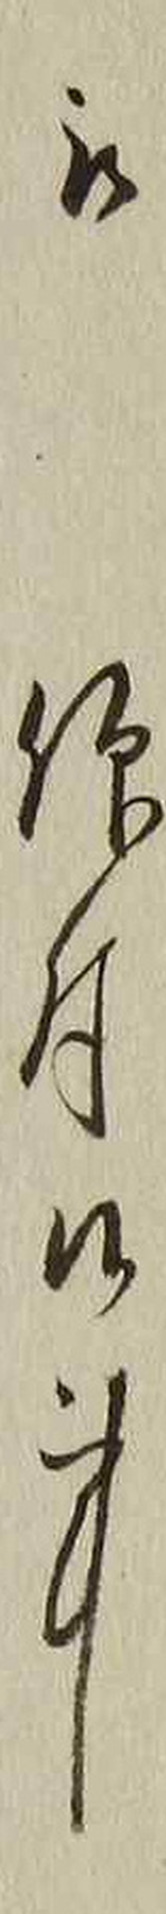被仰付候事
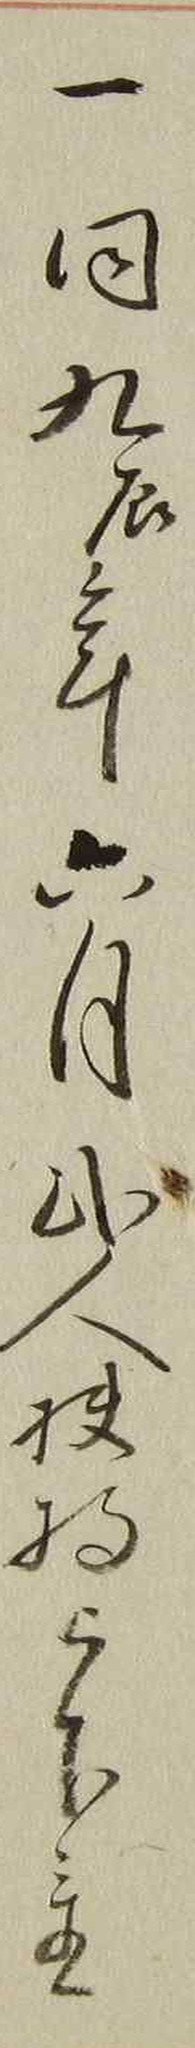一同九辰年六月弐人扶持被下置
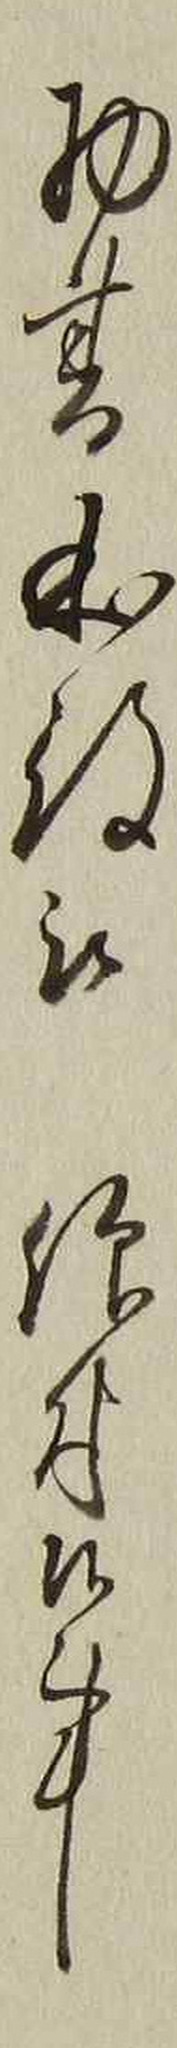物書本役被仰付候事
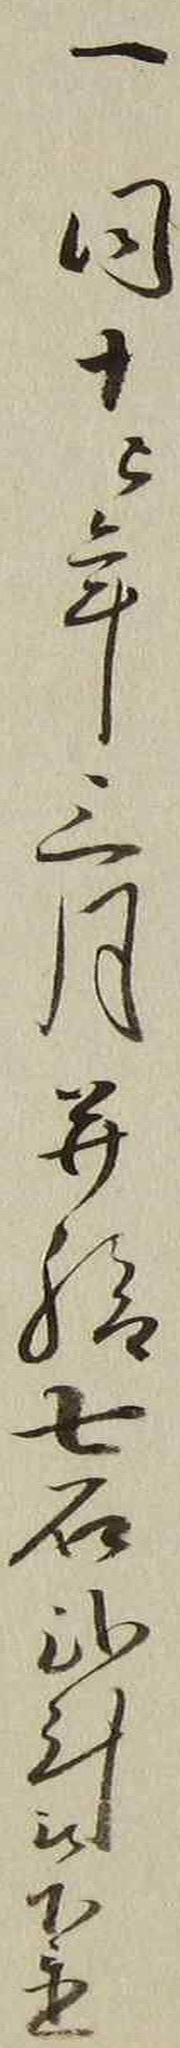一同十巳年三月并給七石弐斗被下置
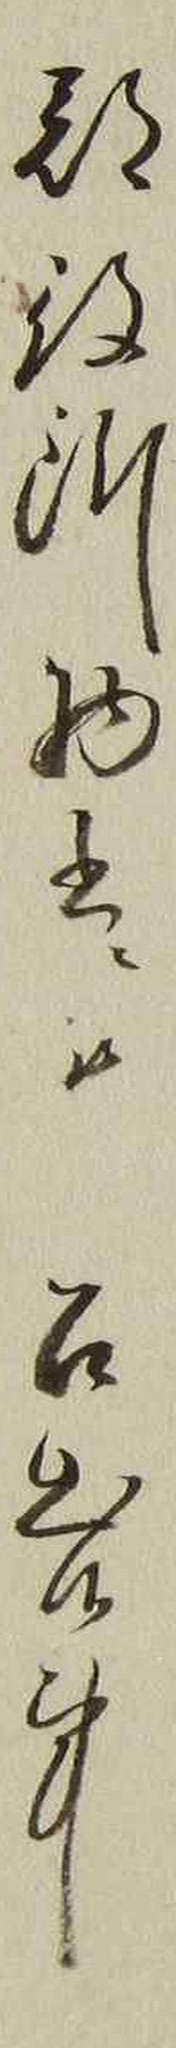郡役所物書ニ被召出候事

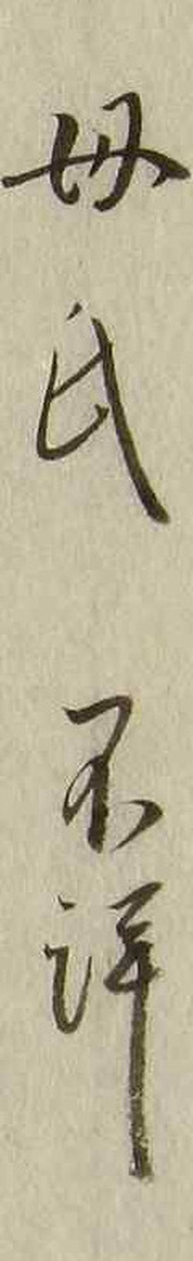母氏不拝
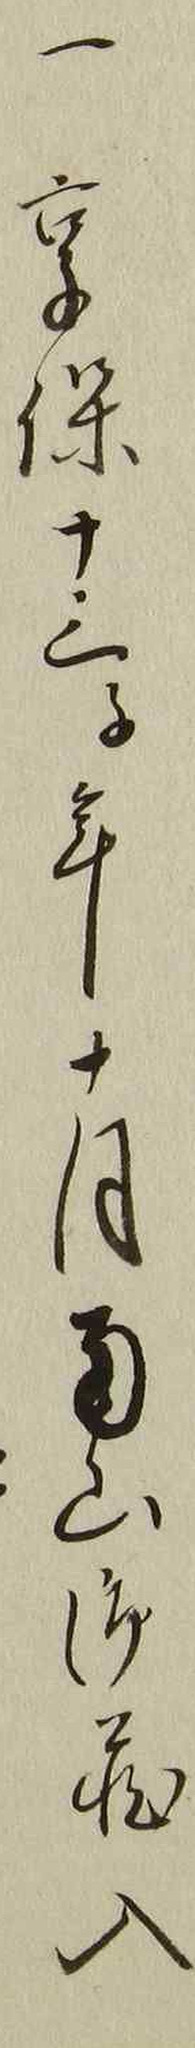一享保十三子年十月南山御蔵入
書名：諸士系譜　巻之132　た之部8
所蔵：会津若松市立会津図書館
